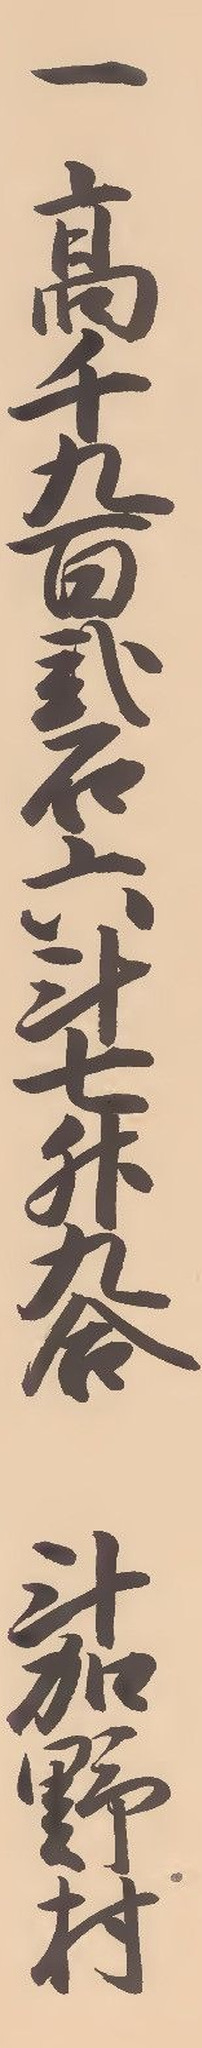一髙千九百弐石六斗七升九合斗加野村
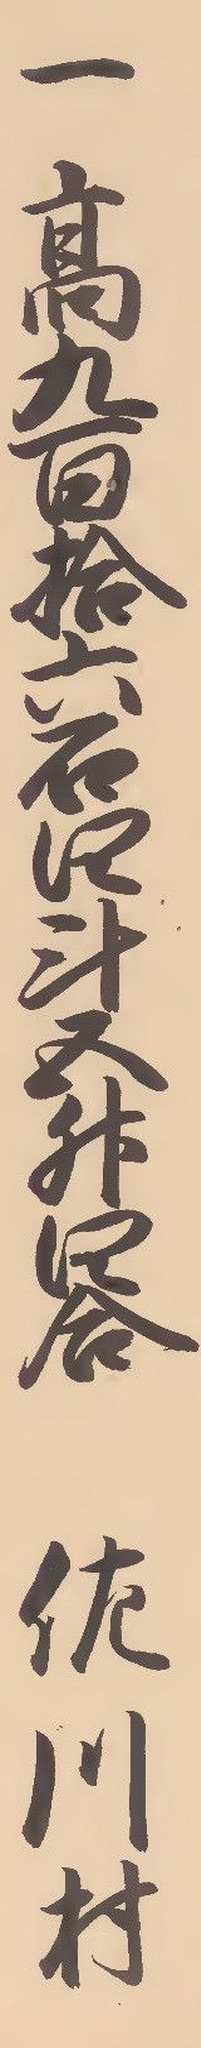一髙九百拾六石四斗五升四合佐川村

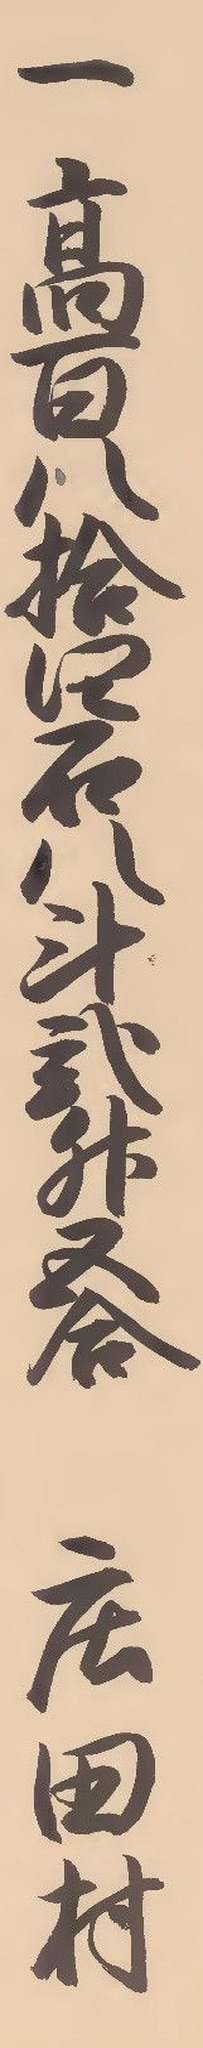一髙百八拾四石八斗弐升五合庄田村
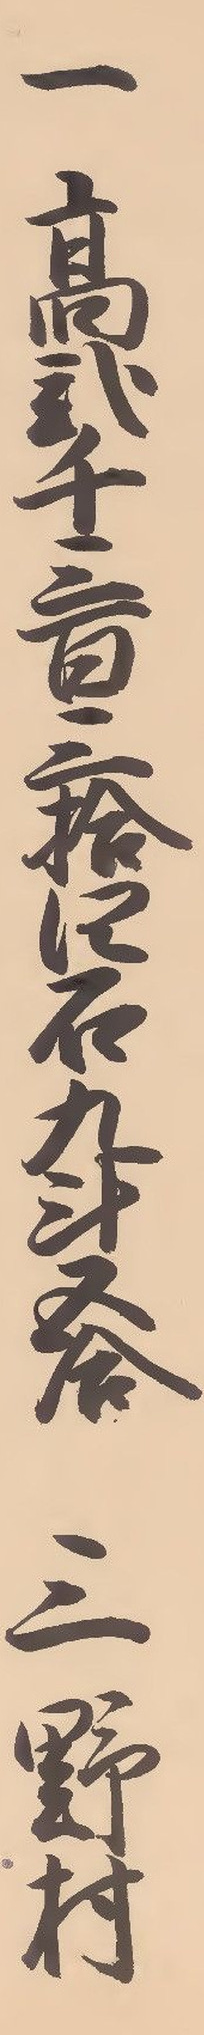一髙弐千三百三拾四石九斗五合三野村
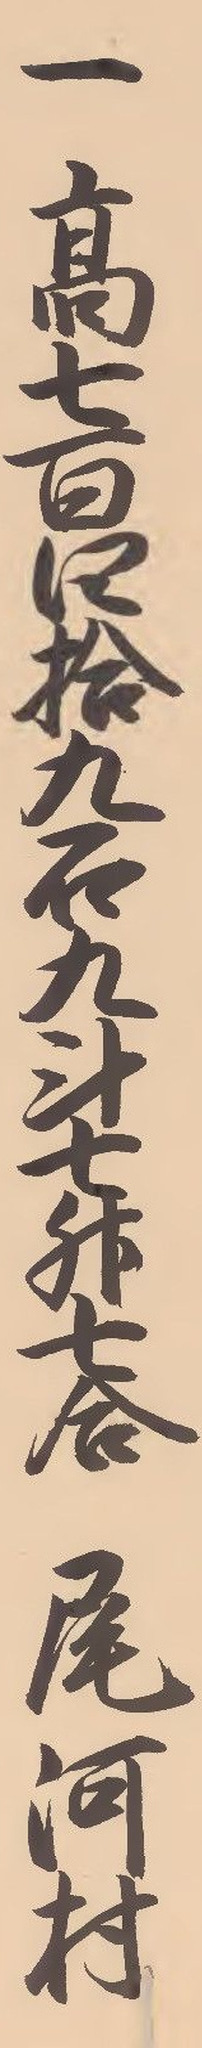一髙七百四拾九石九斗七升七合尾河村
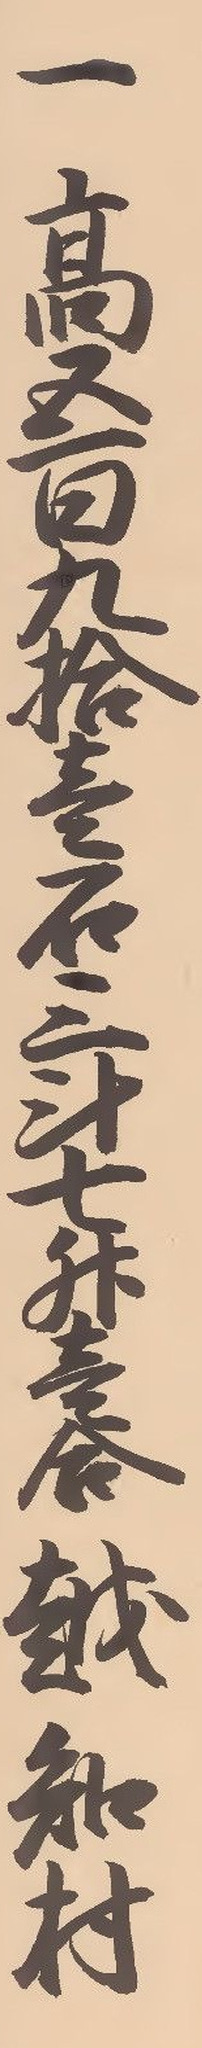一髙五百九拾壱石三斗七升壱合越知村
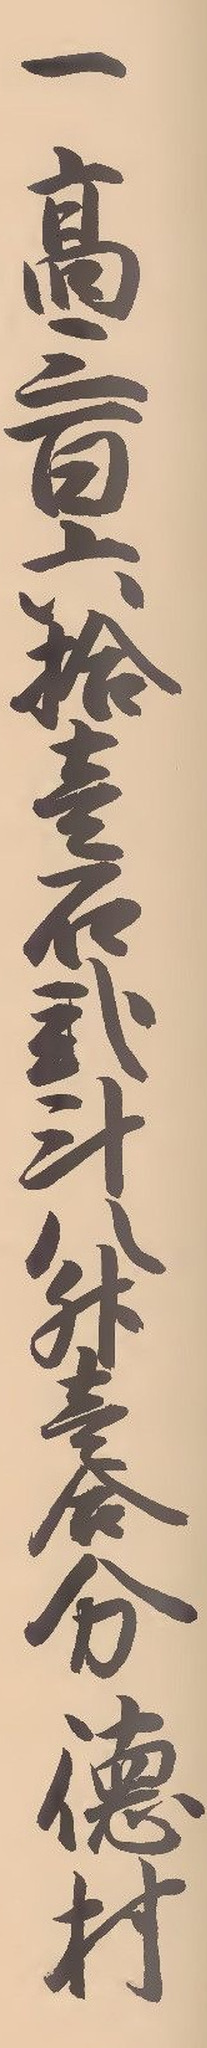一髙三百六拾壱石弐斗八升壱合分徳村
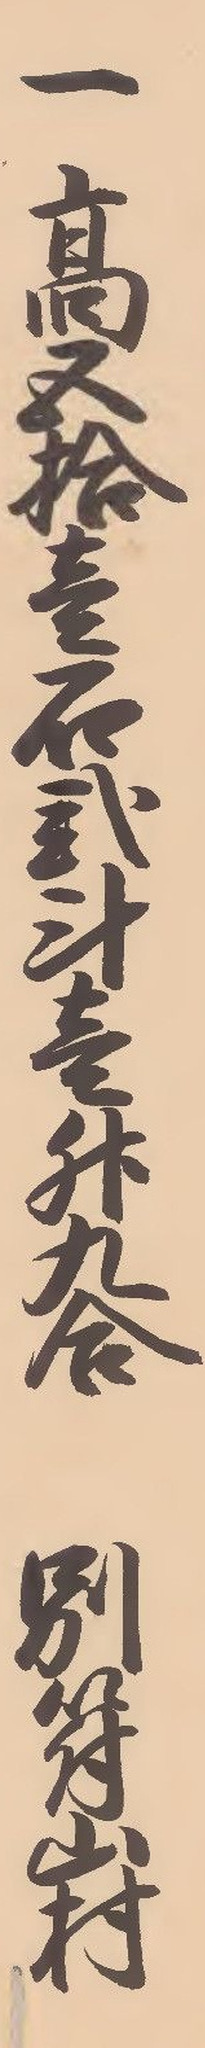一髙五拾壱石弐斗壱升九合別符山村
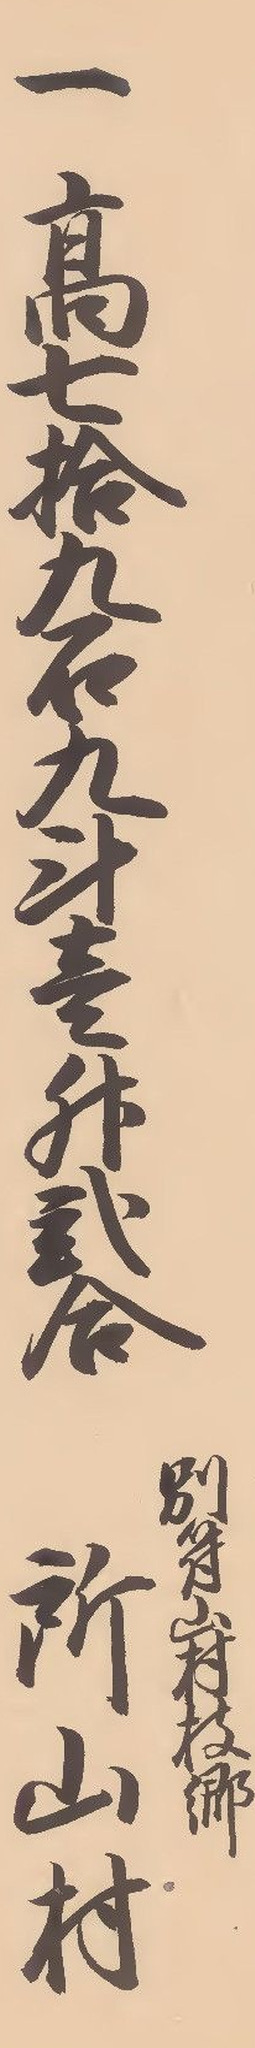一髙七拾九石九斗壱升弐合所山村

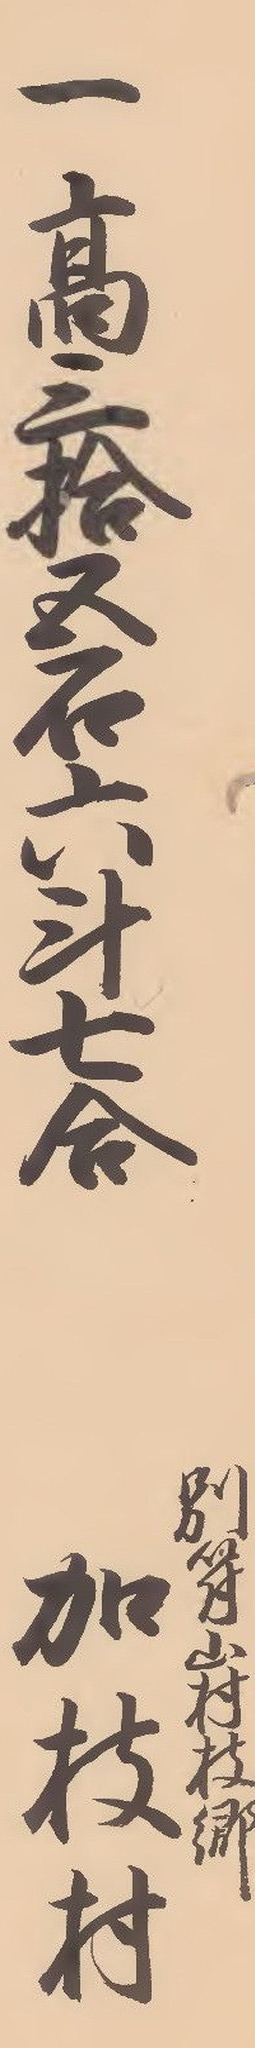一髙三拾五石六斗七合加枝村
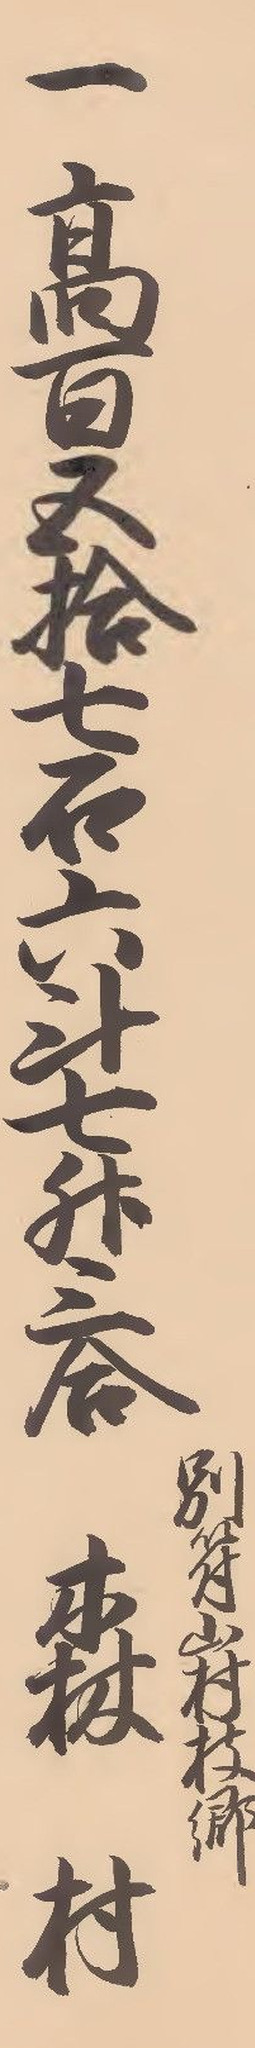一髙百五拾七石六斗七升三合森村
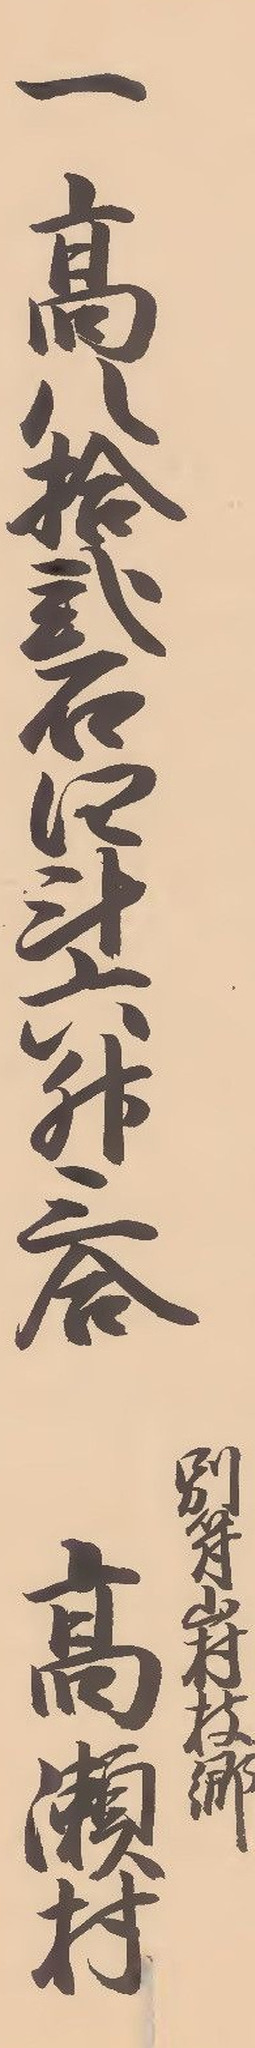一髙八拾弐石四斗六升三合髙瀬村
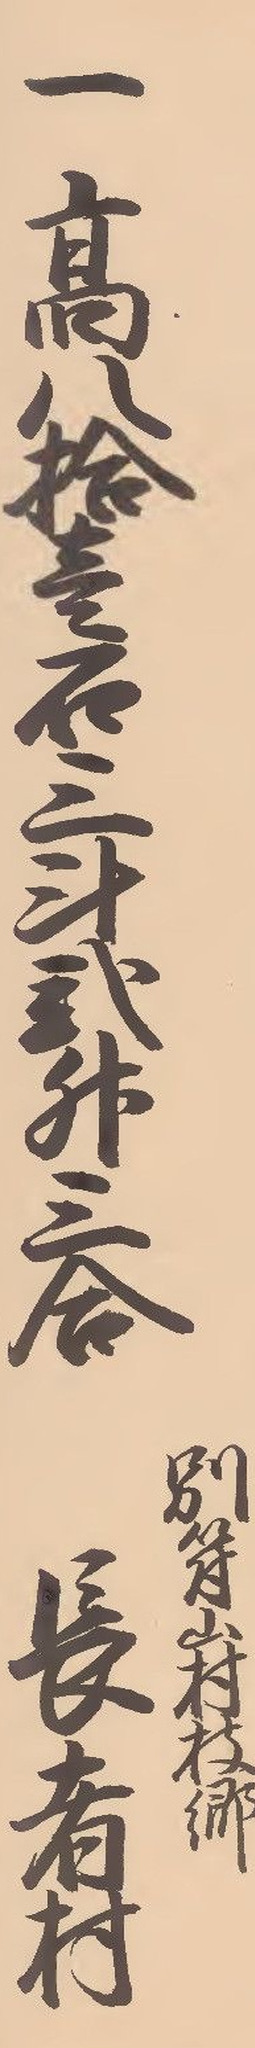一髙八拾壱石三斗弐升三合長者村
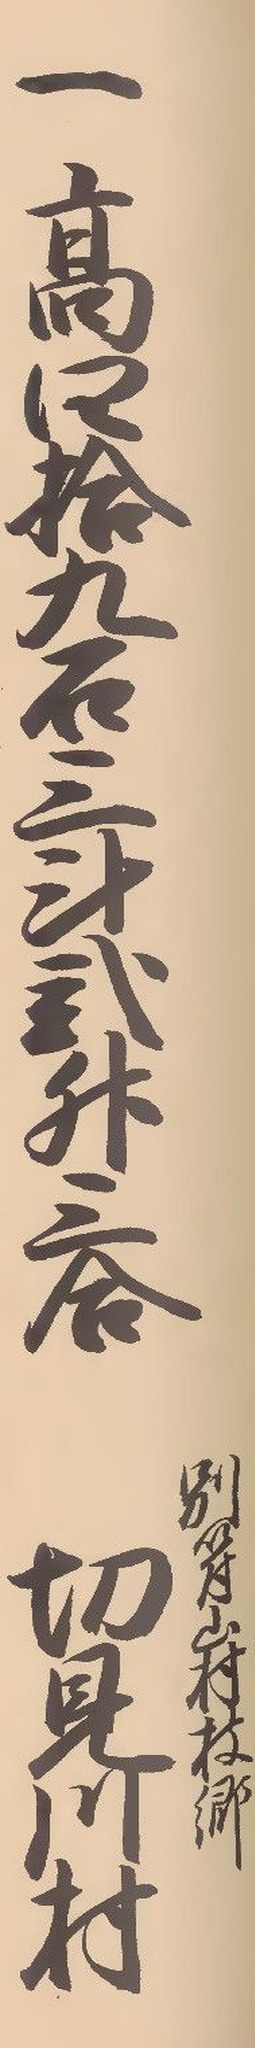一髙四拾九石三斗弐升三合切見川村
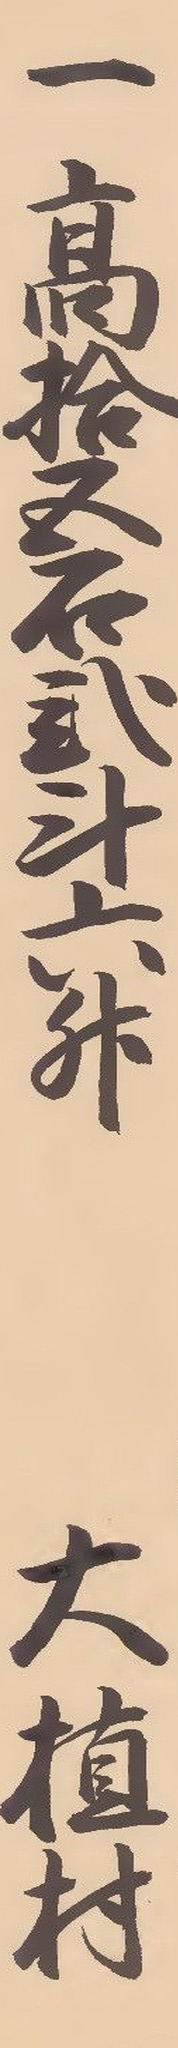一髙拾五石弐斗六升大植村

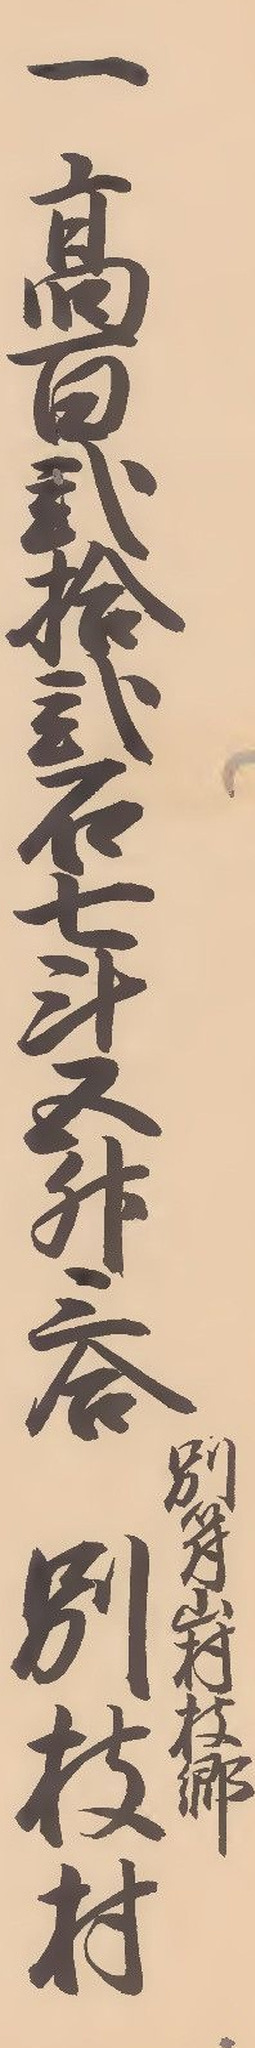一髙百弐拾弐石七斗五升三合別枝村
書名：土佐国郷帳
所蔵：国立公文書館 National Archives of Japan
